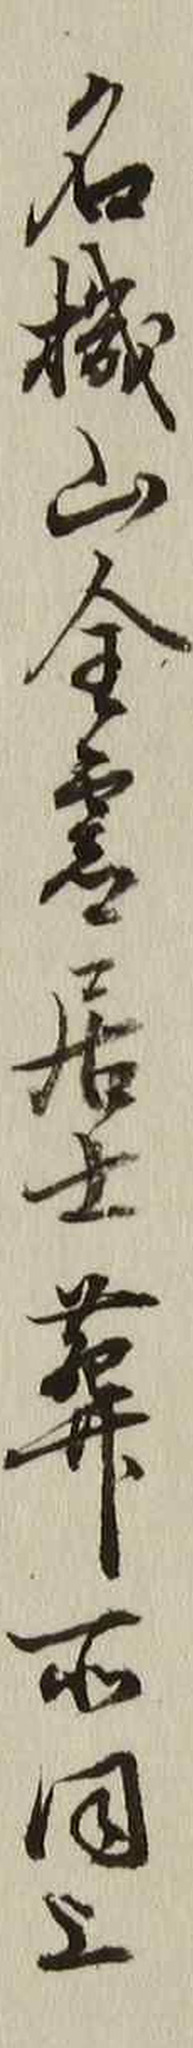名機山全霊居士葬所同上
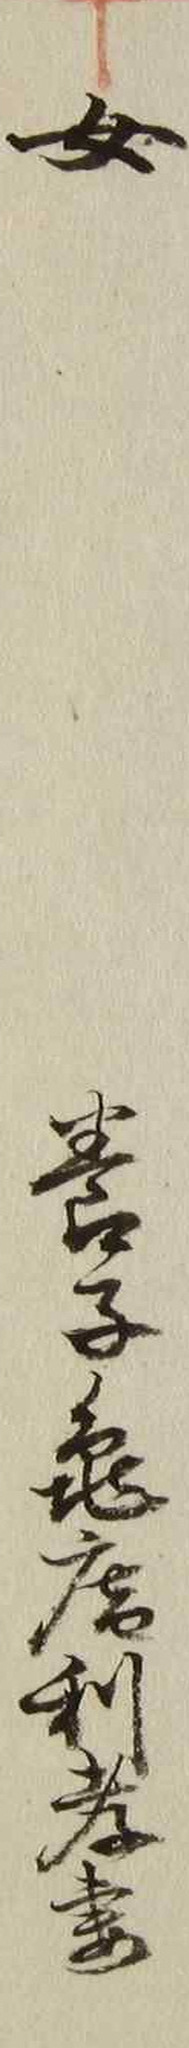女養子亀庵利孝妻
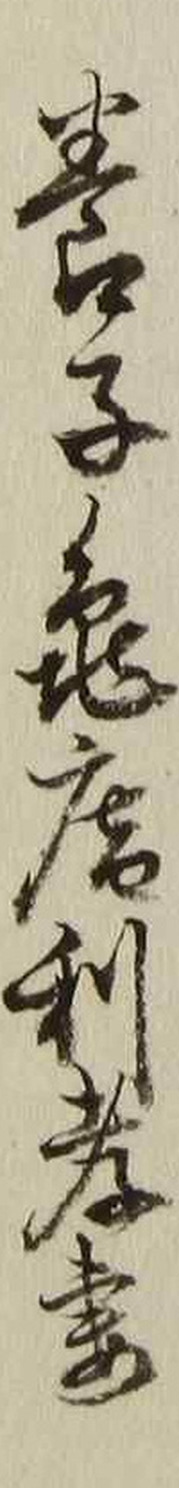女養子亀庵利孝妻
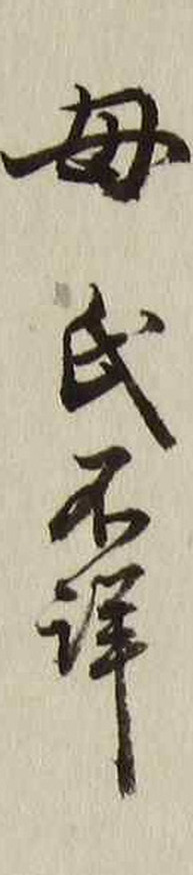母氏不詳
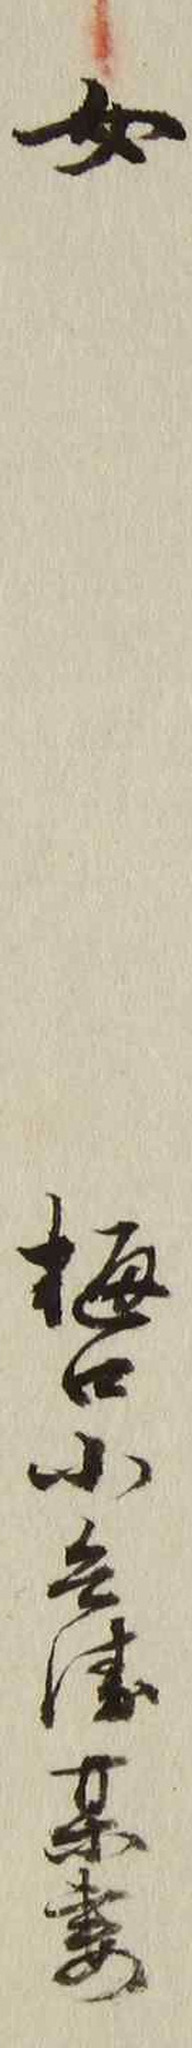女樋口小兵衛某妻
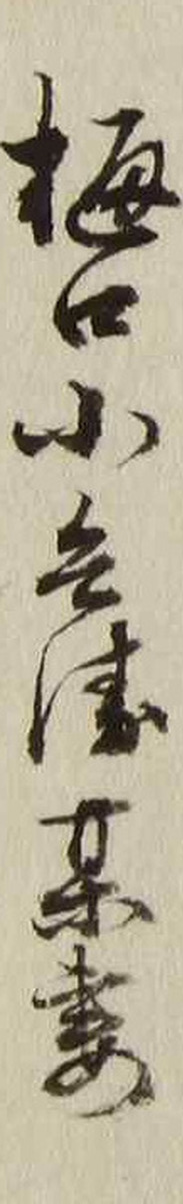女樋口小兵衛某妻
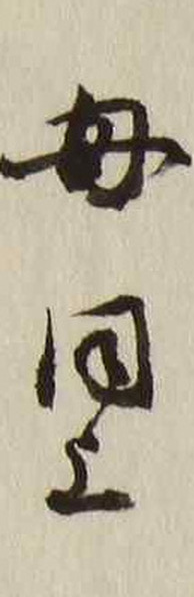母同上

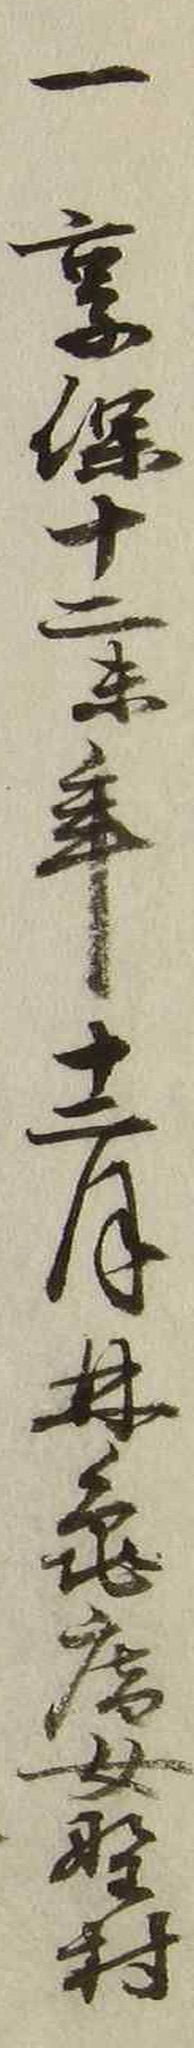一享保十二未年十二月林亀庵女野村
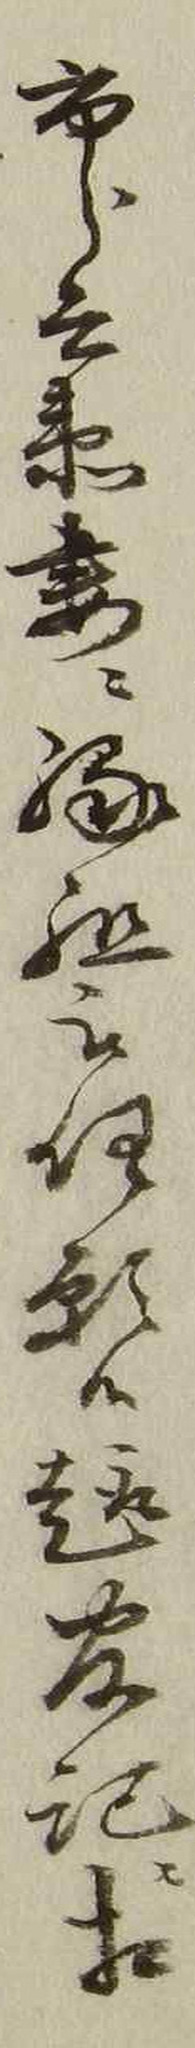市郎兵衛妻ニ縁組被任願候趣官記ニ相
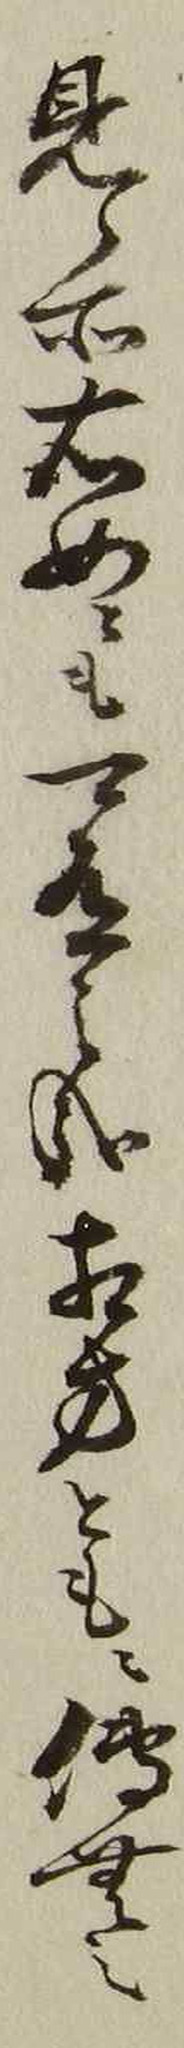見候所右女ニも可有之哉相方ともニ伝無之
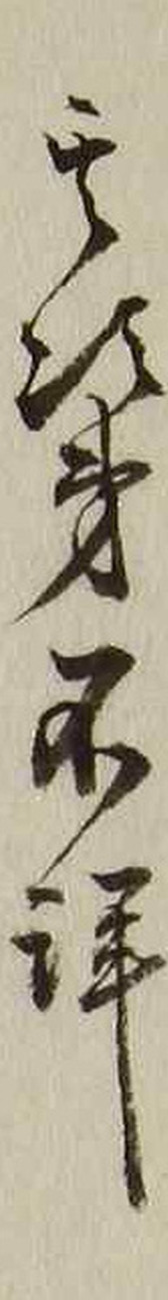其次第不拝
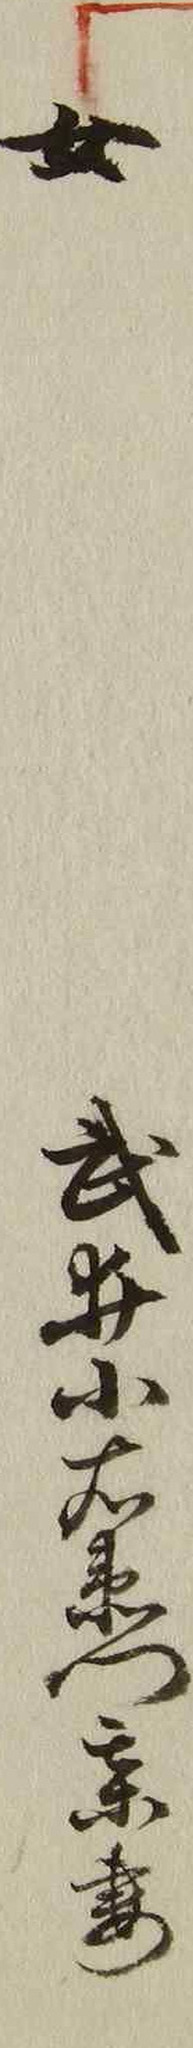女武井小右衛門某妻
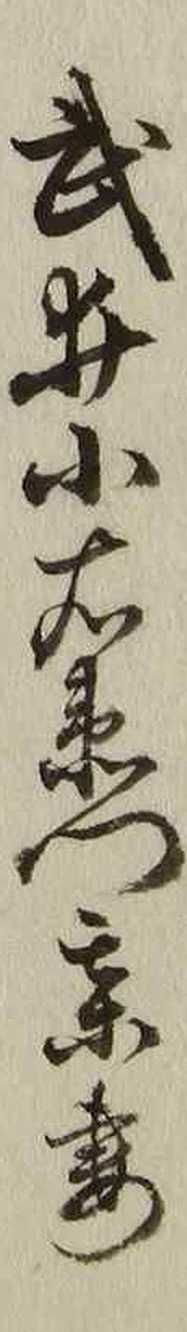女武井小右衛門某妻
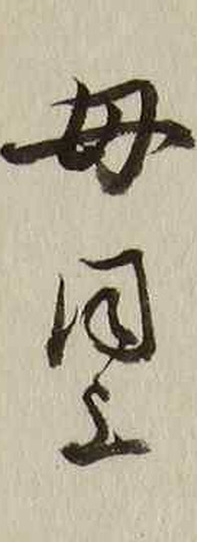母同上
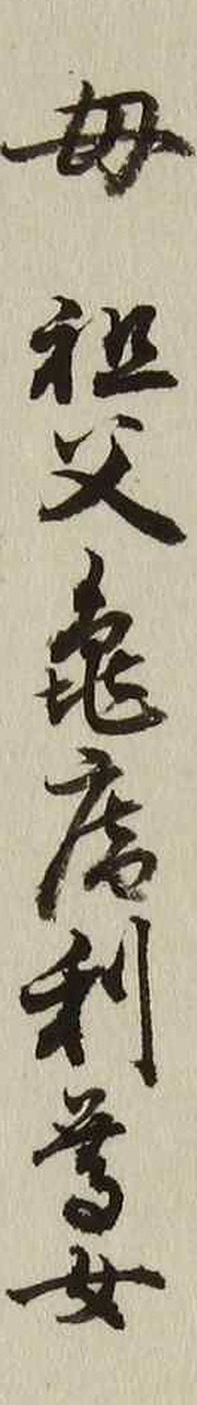母祖父亀庵利尊女
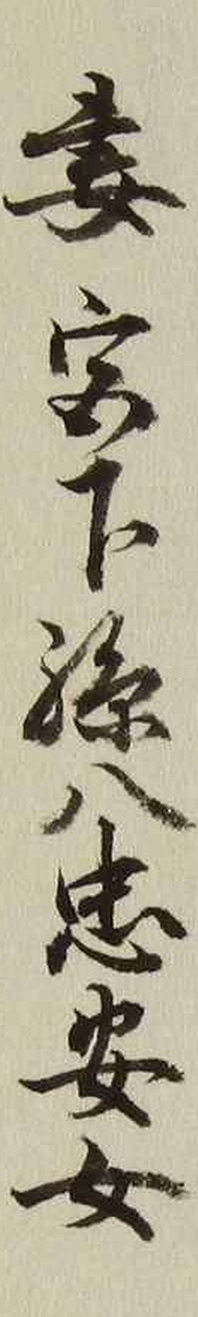妻宮下孫八忠安女
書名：諸士系譜　巻之39　は之部7
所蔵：会津若松市立会津図書館
